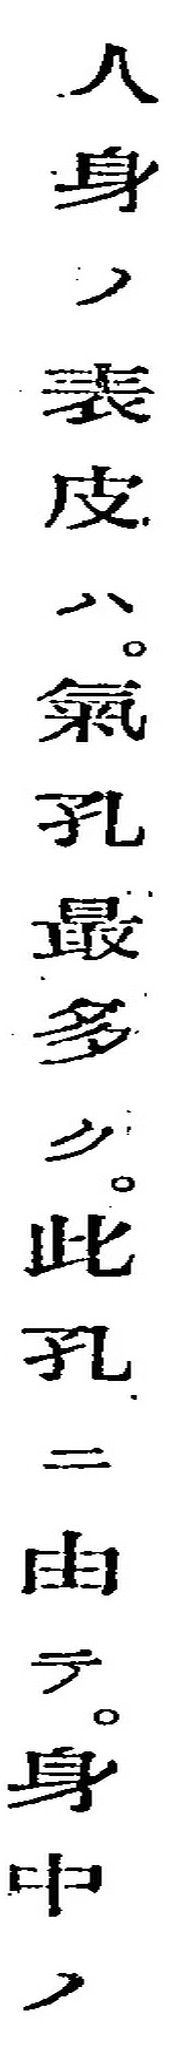人身の表皮は。気孔最多く。此孔に由て。身中の
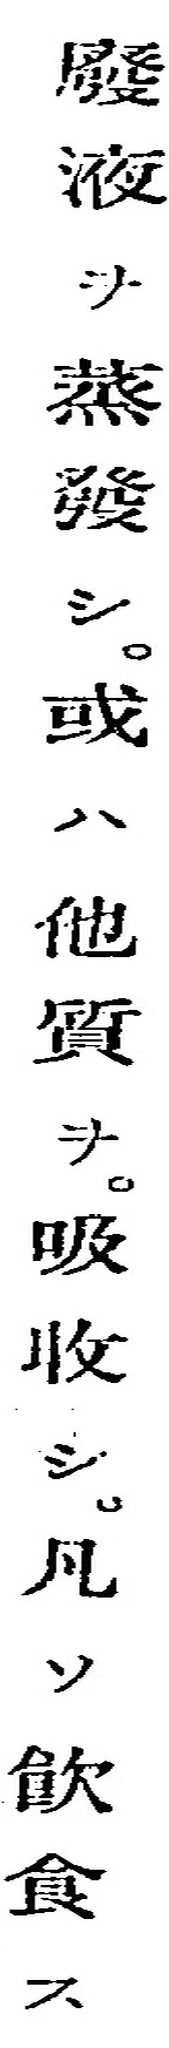廃液を蒸発し。或は他質を。吸収し、凡そ飲食す
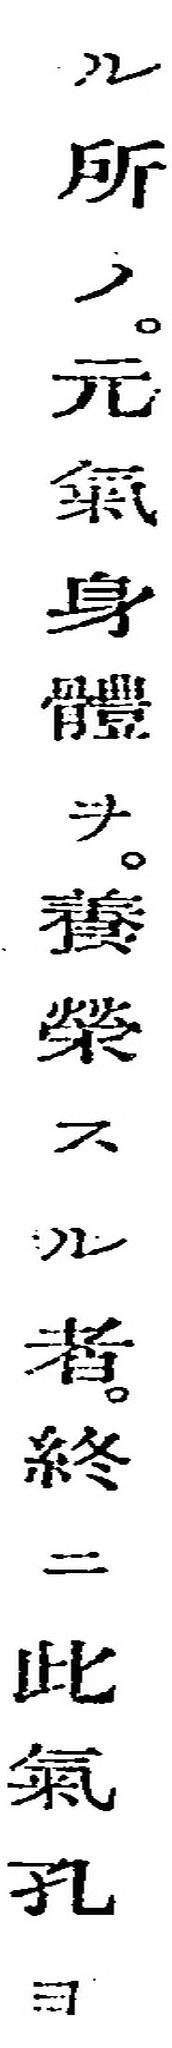る所の、元気身体を。養栄する者。終に此気孔よ
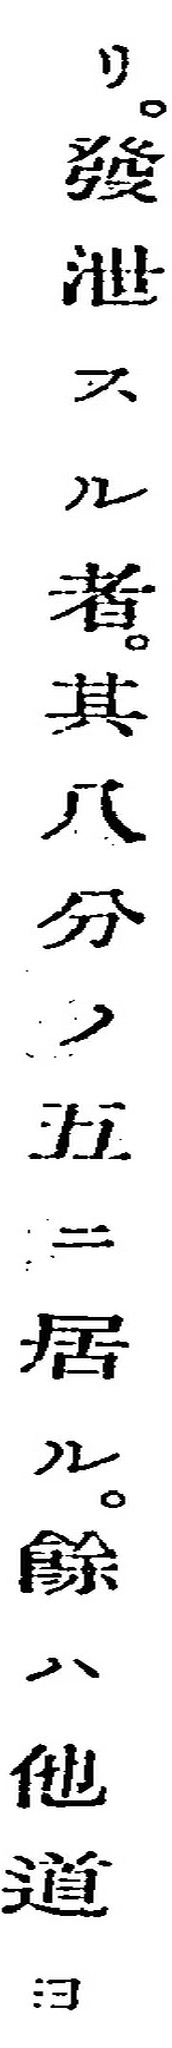り。發泄する者。其八分の五に居る。余は他道よ
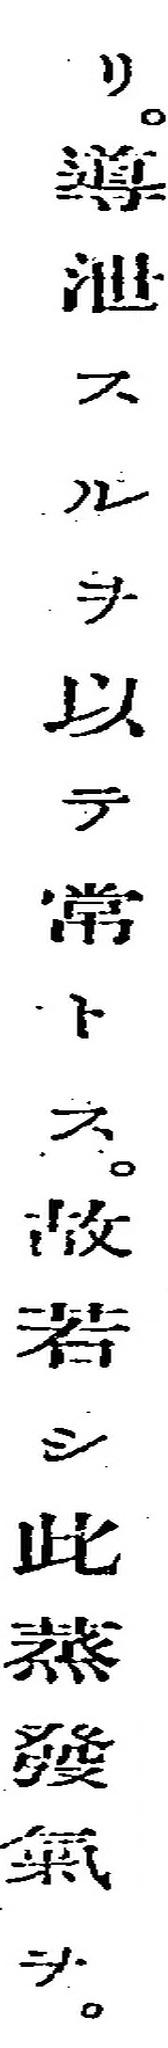り。導泄するを以て常とす。故若し此蒸発気を。
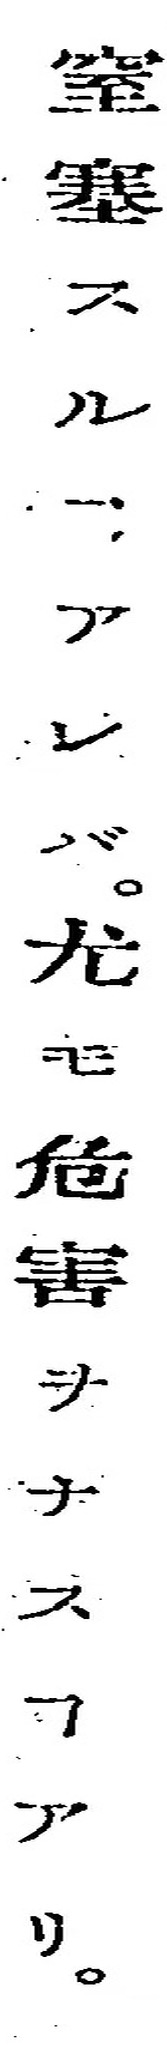窒塞することあれば。尤も危害をなすことあり。
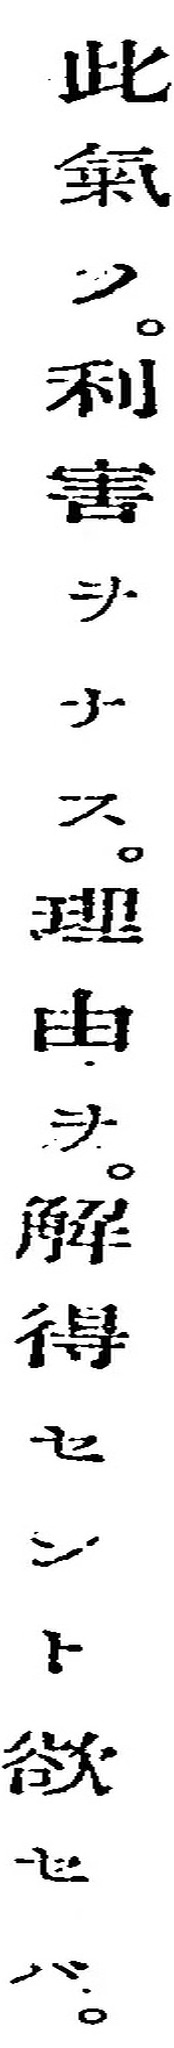此気の。利害をなす。理由を。解得せんと欲せば。
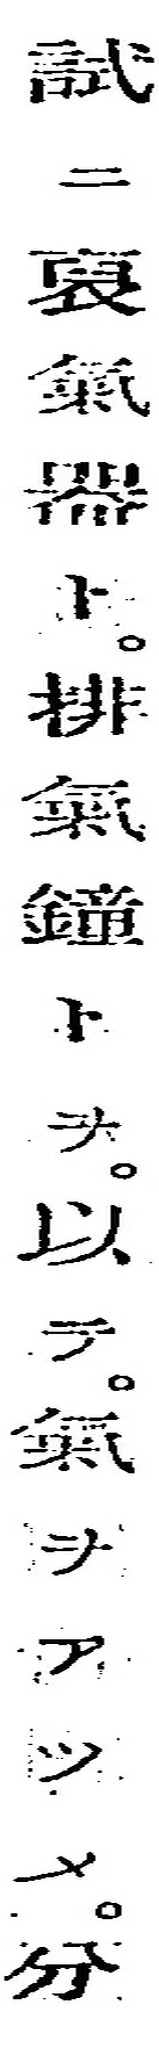試に衰気器と。排気鐘とを。以て。気をあつめ。分
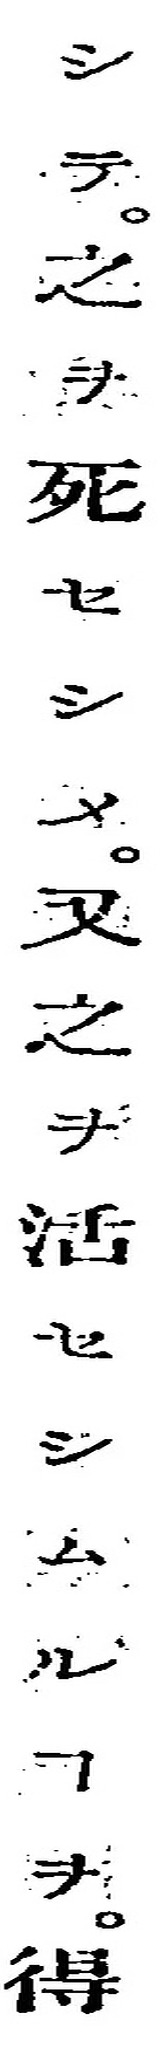して。之を死せしめ。又之を活せしむることを。得
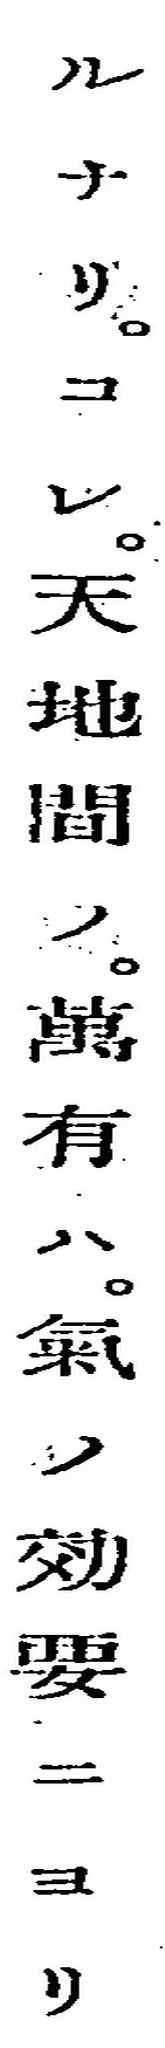るなり。これ。天地間の。万有は、気の効要により
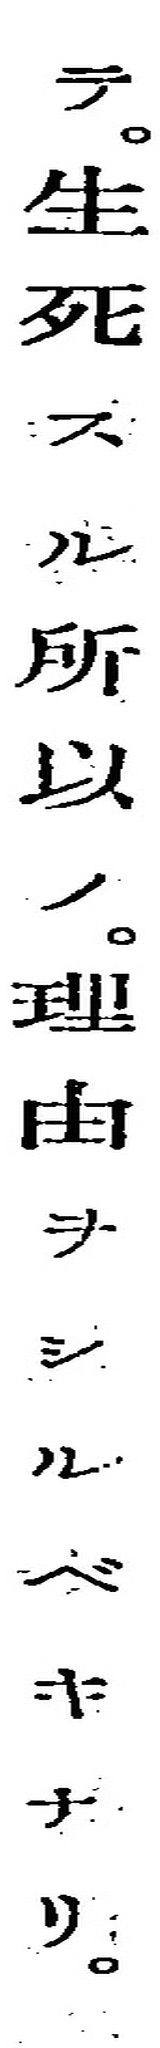て。生死する所以の。理由をしるべきなり。
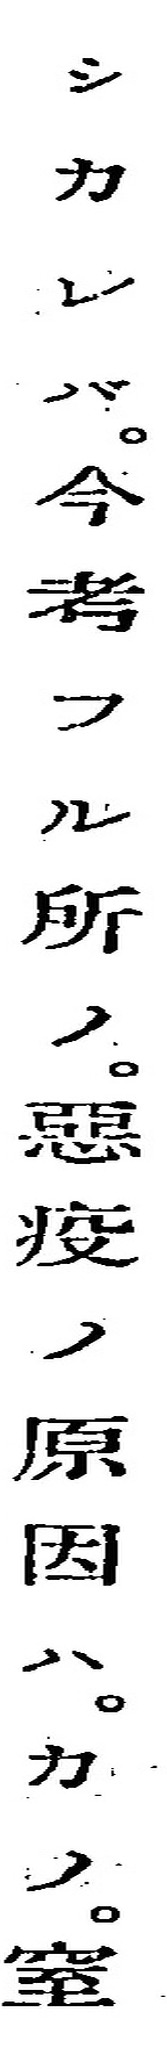しかればしかれば。今考ふる所の。悪疫の原因は。かの。窒
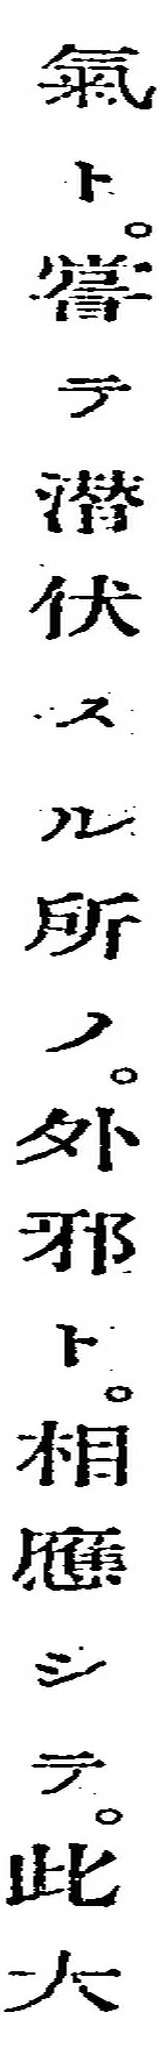気と。嘗て潜伏する所の。外邪と。相応して。此大
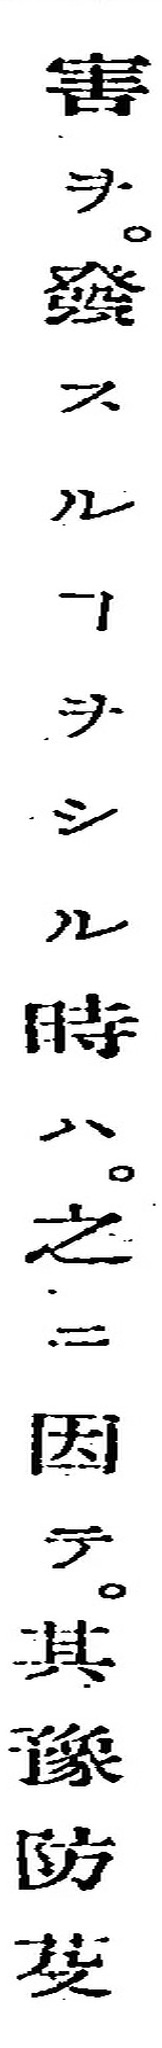害を。発することをしる時は。之に因て。其予防芟
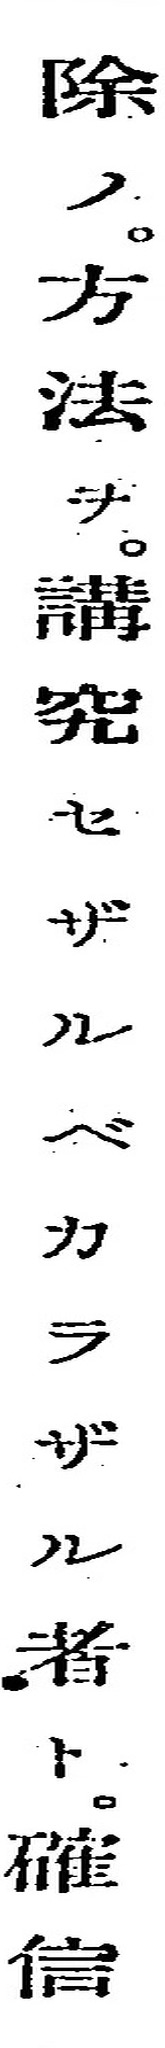除の。方法を。講究せざるべからざる者と。確信

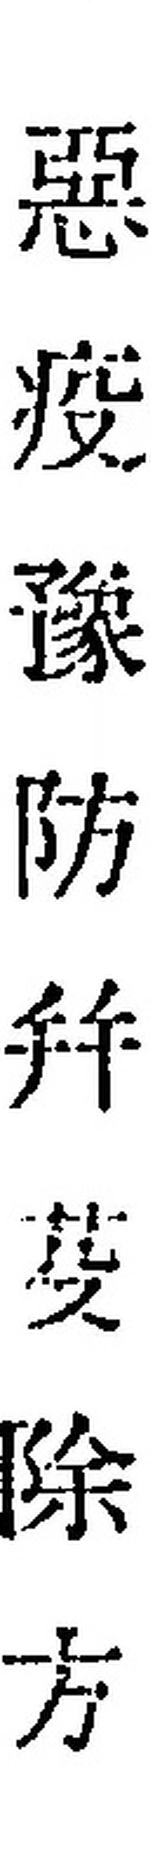悪疫予防幷芟除法
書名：駆疫法 : コレラヲヨケ並ニナホスシカタ
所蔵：国立国会図書館 National Diet Library, JAPAN
